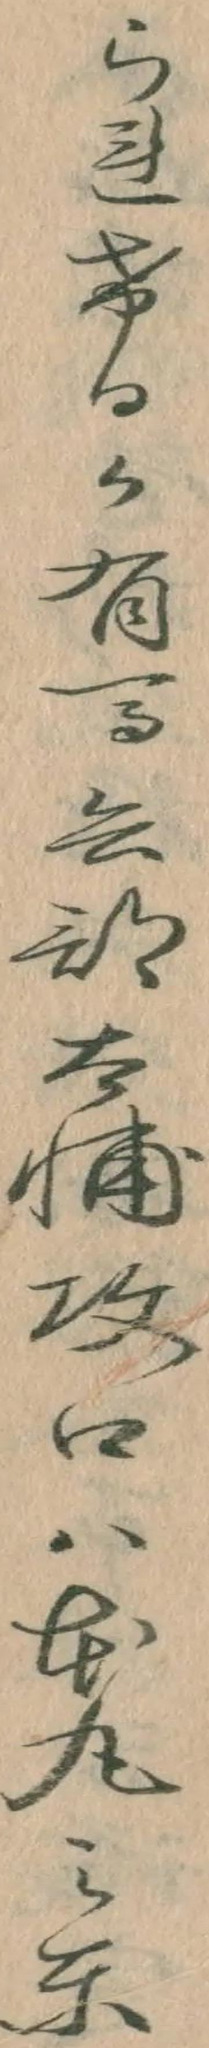ら連希るか有馬兵部太輔攻口は本丸之東
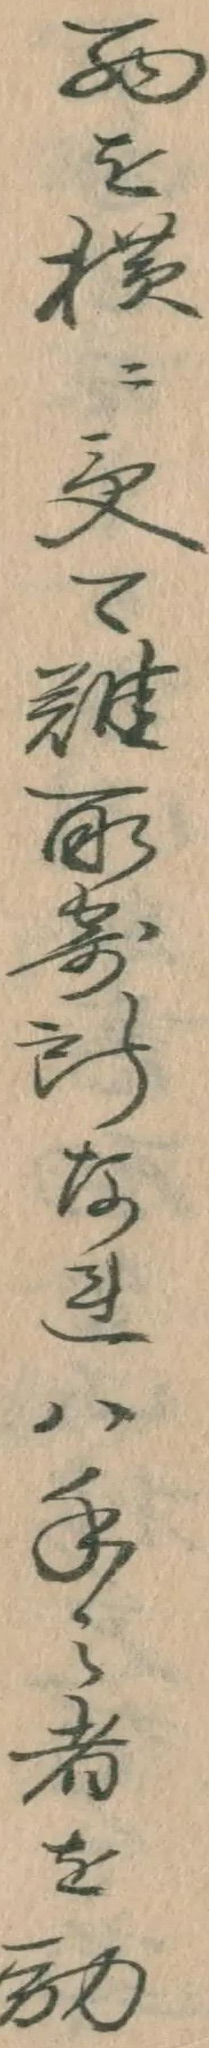西を横に受て難取寄所な連は手之者を励
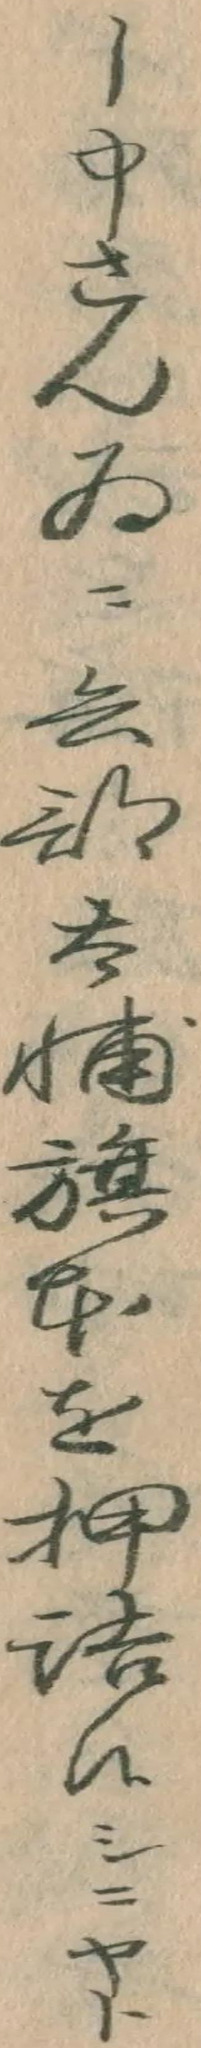し申さんゐに兵部太輔旗本を押詰候しにやと
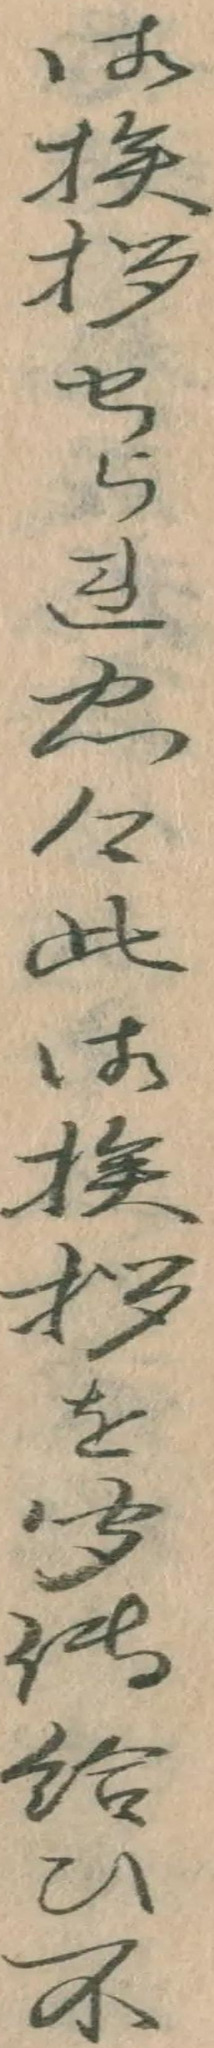御挨拶せら連忠郷此御挨拶を聞伝給ひ不
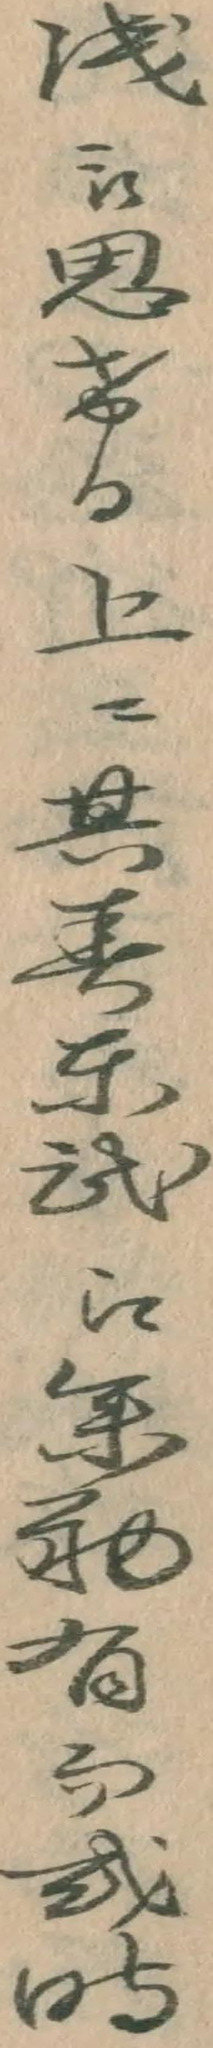浅被思希る上に其春東武江参勤有而或時
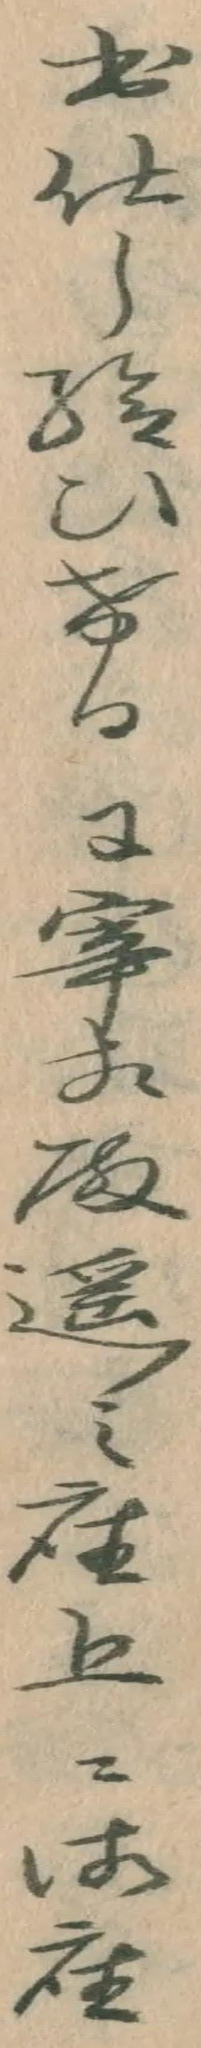出仕し給ひ希る尓宰相殿遥之座上に御座
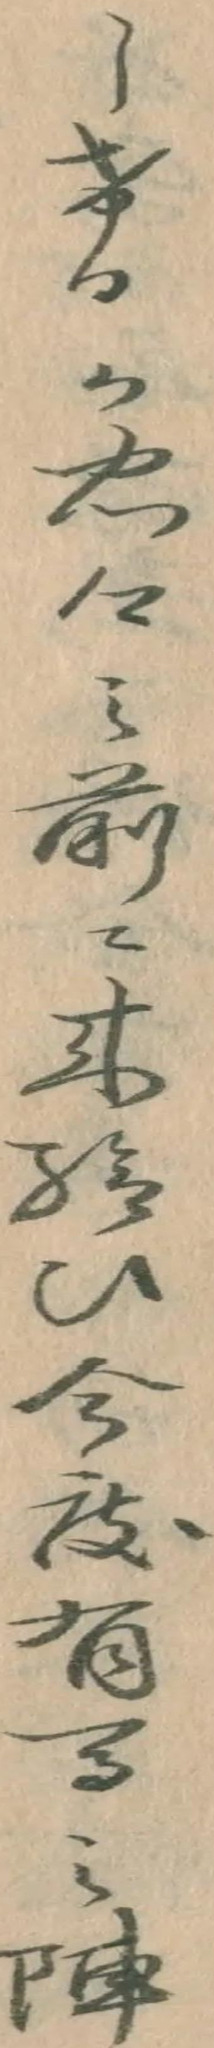し希るか忠郷之前に来給ひ今度有馬之陣
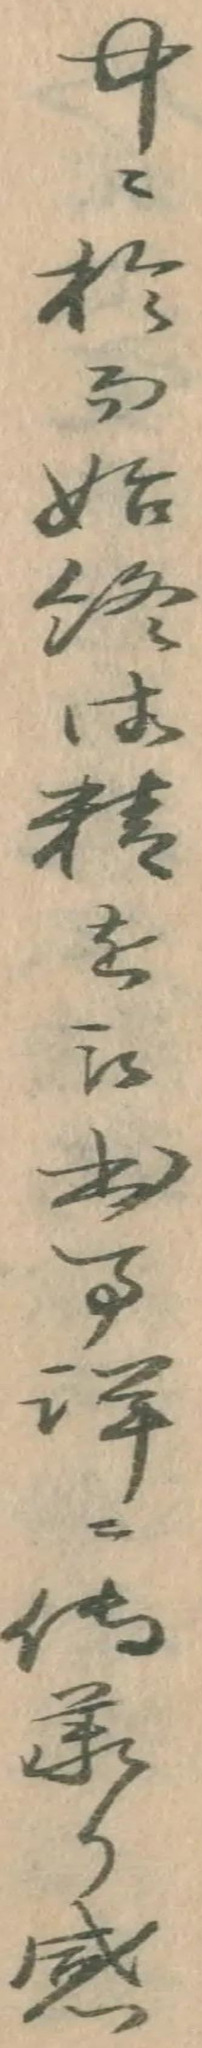中に於而始終御精を被出事詳に伝承り感

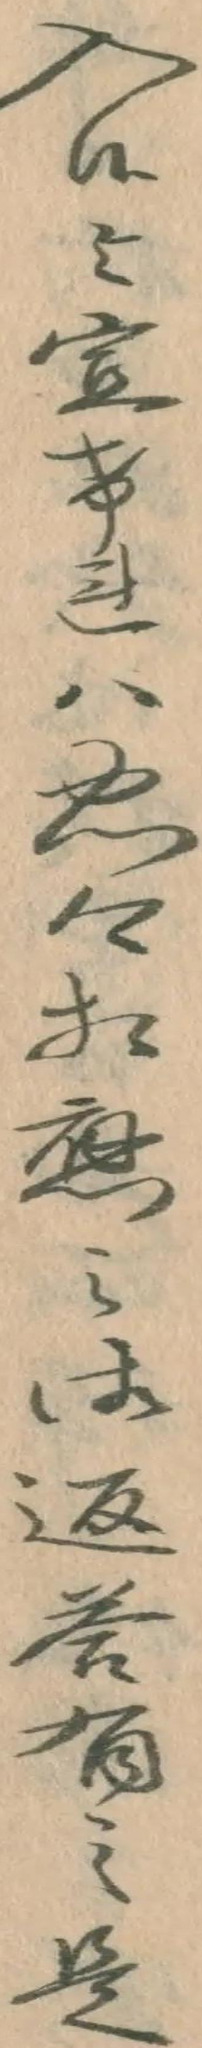入候与宣希連は忠郷相應之御返答有之是
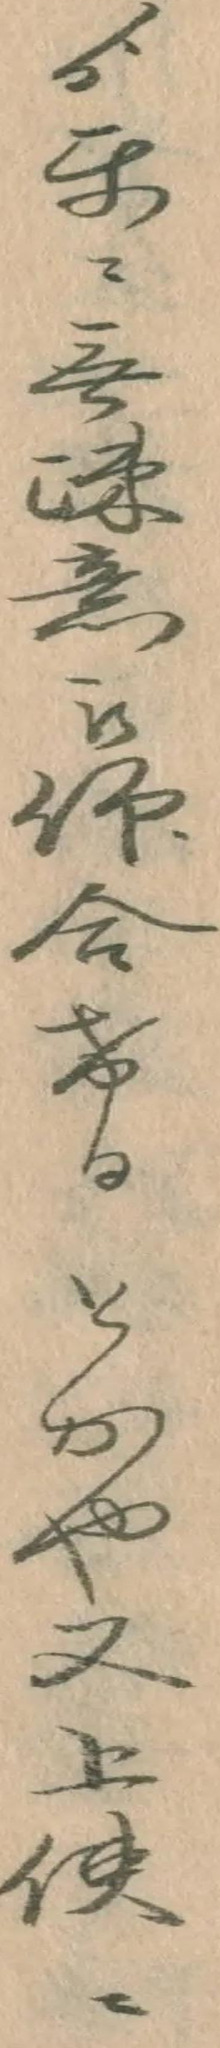ゟ互に無疎意被仰合希るとかや又上使に
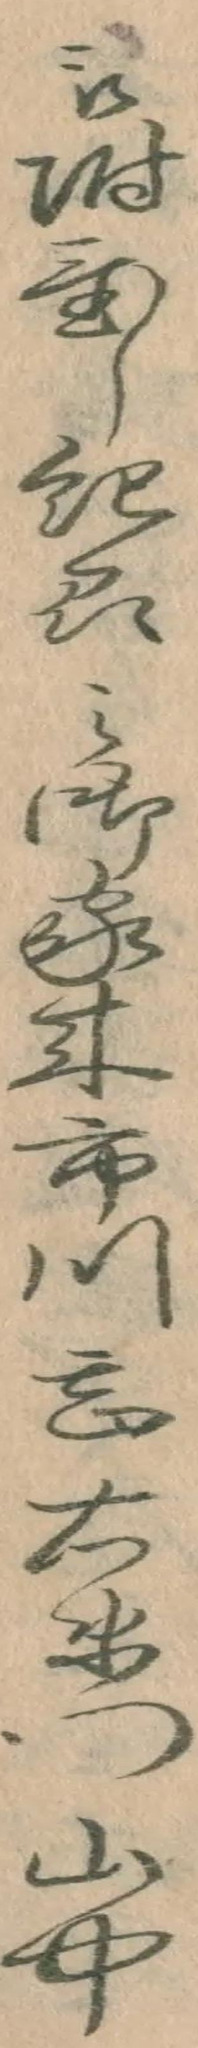被附置し紀州之御家来市川甚右衛門山中
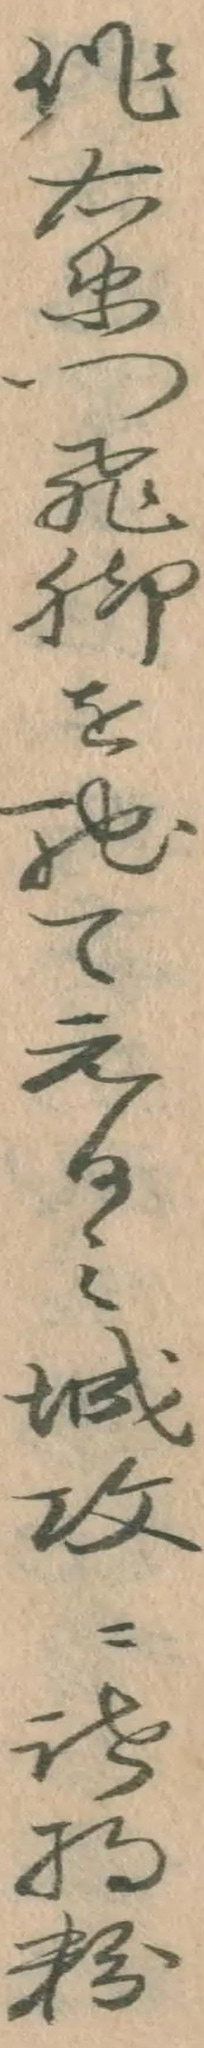作右衛門飛脚を馳て元日之城攻に諸将粉
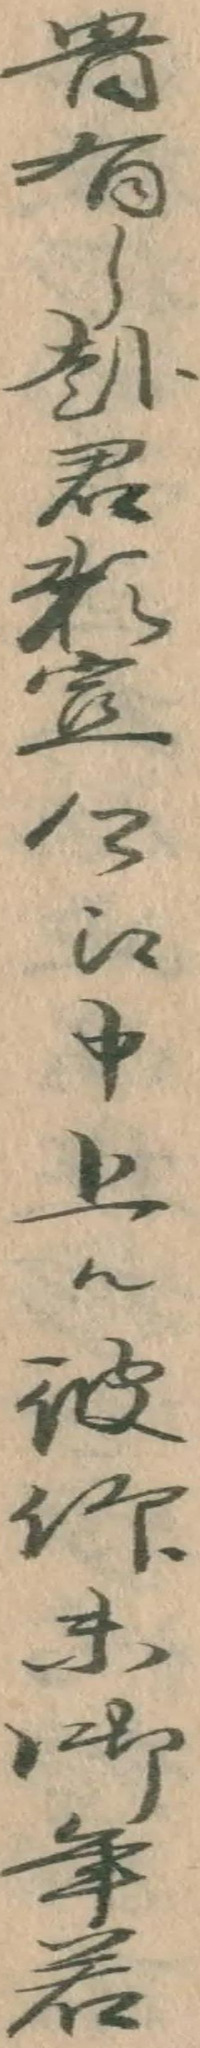骨有し赴君頼宣卿江申上ん彼仰未御年若
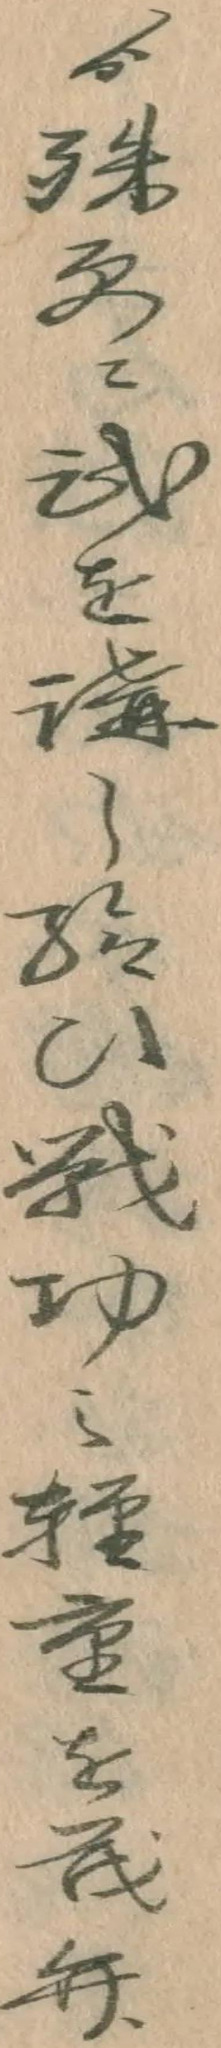ゟ殊更に武を講し給ひ戦功之軽重を茂弁
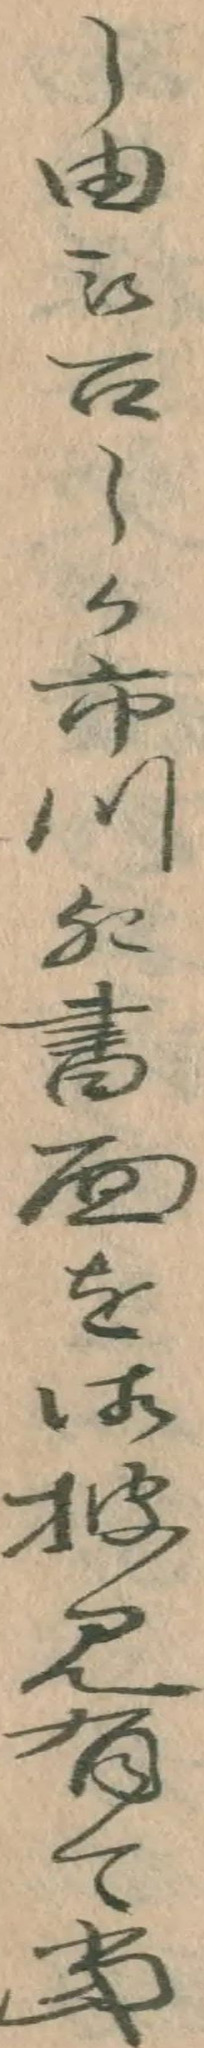し由被召しか市川歟書面を御披見有て当
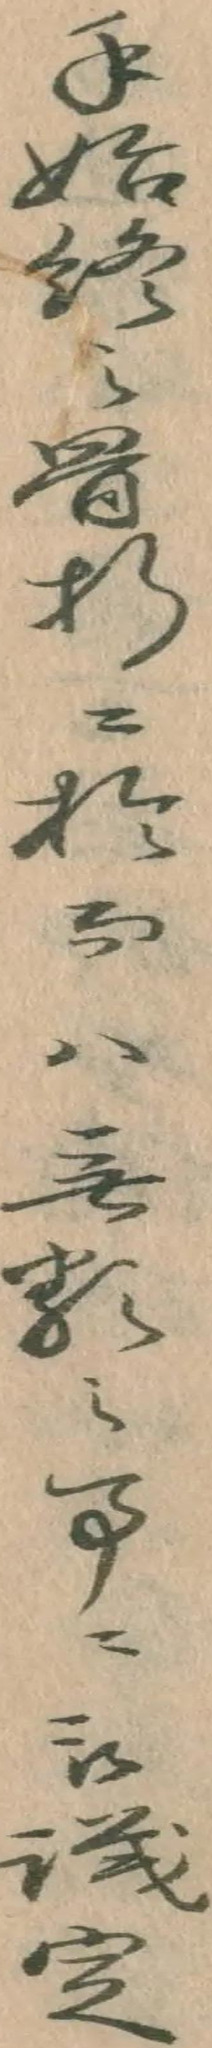手始終之骨折に於而は無類之事に被議定
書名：切支丹御退治記 49巻. [5]
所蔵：国立国会図書館 National Diet Library, JAPAN
